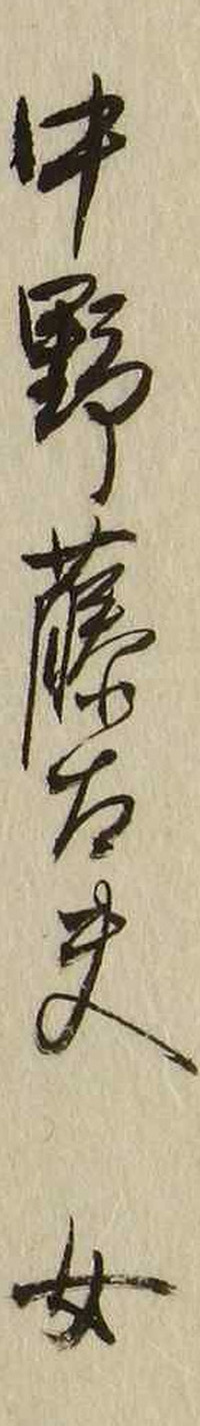中野藤太夫女
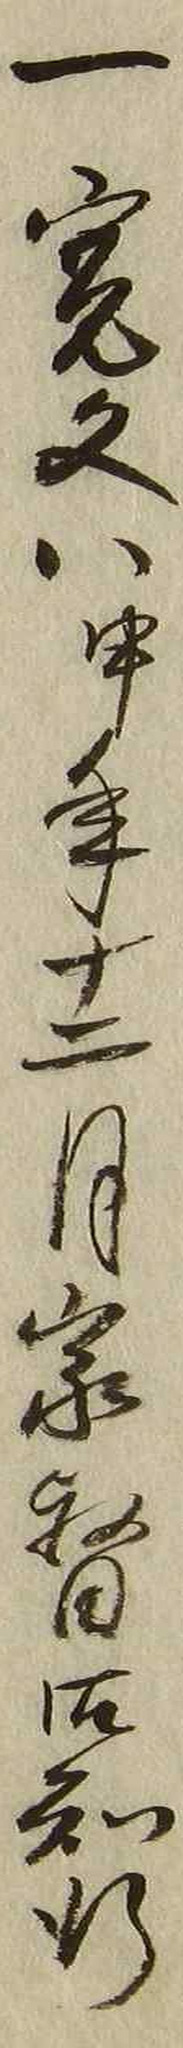一寛文八申年十二月家督御知行
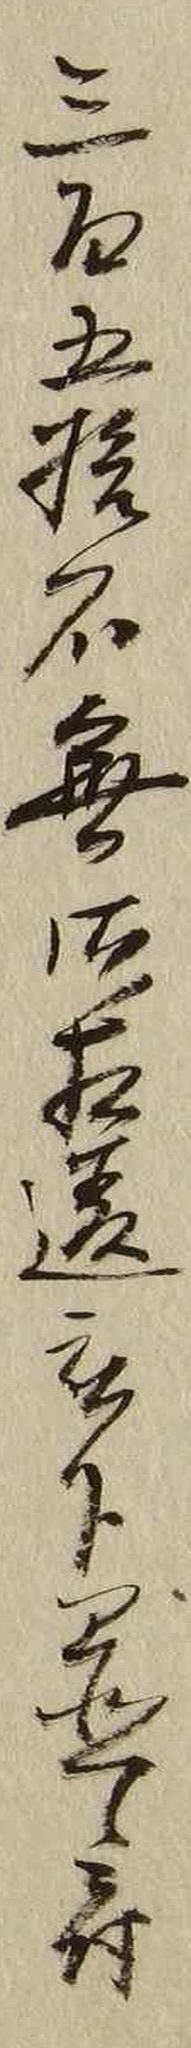三百五拾石無御相違被下置候ニ付
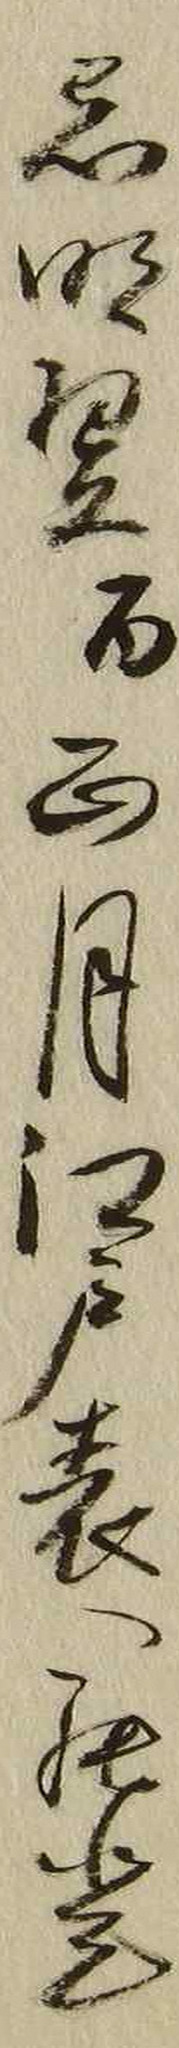忌明翌酉正月江戸表へ罷登
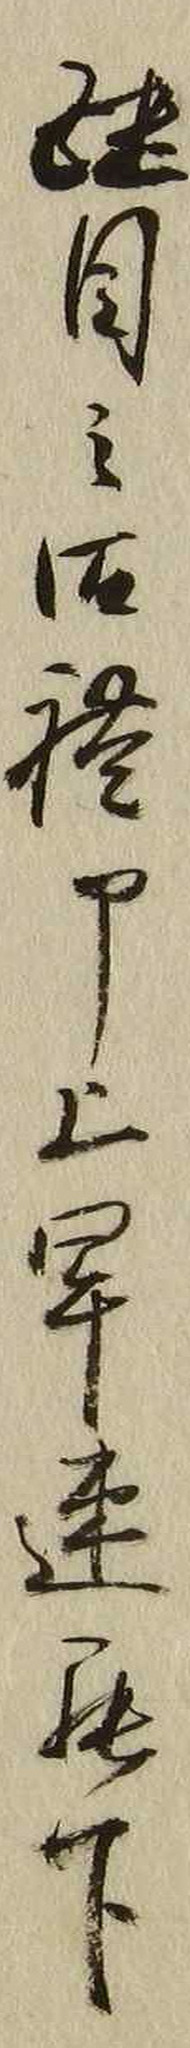継目之御礼申上早速罷下
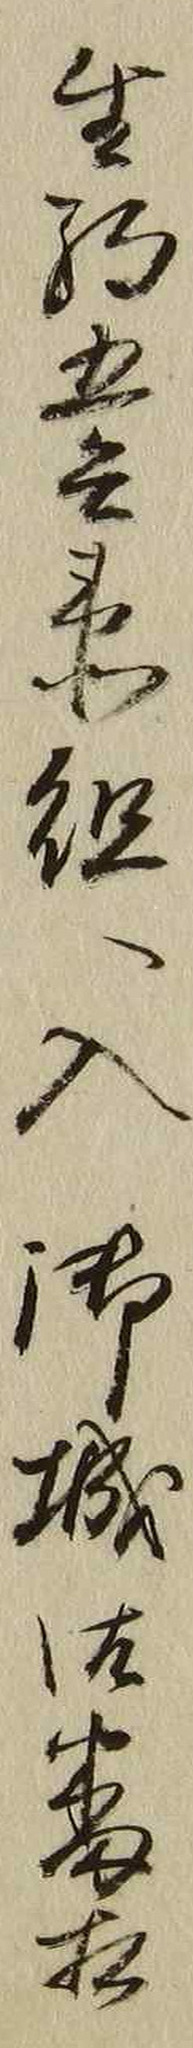生駒五兵衛組へ入御城御番相
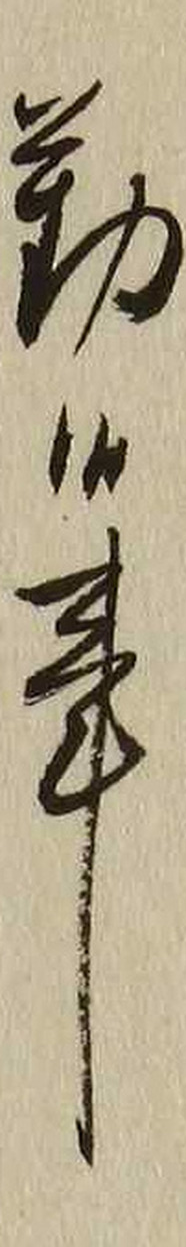勤候事
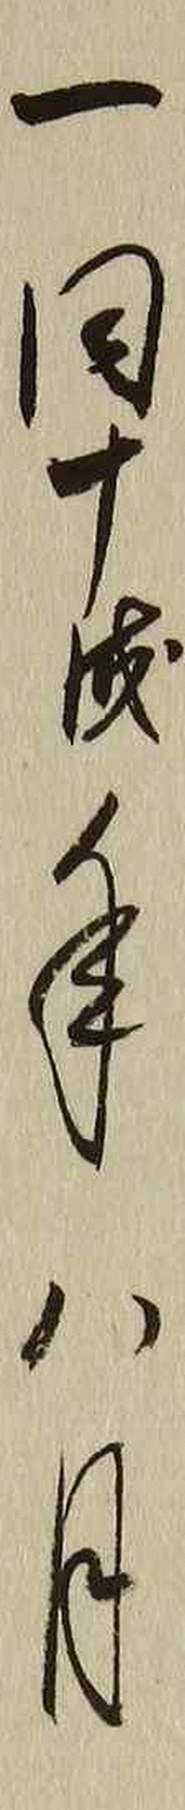一同十戌年八月
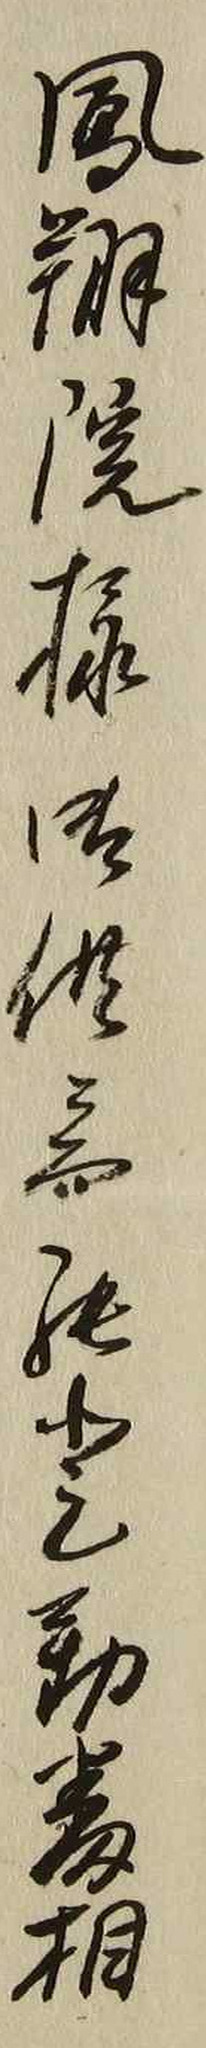鳳翔院様御供ニ而罷登勤番相
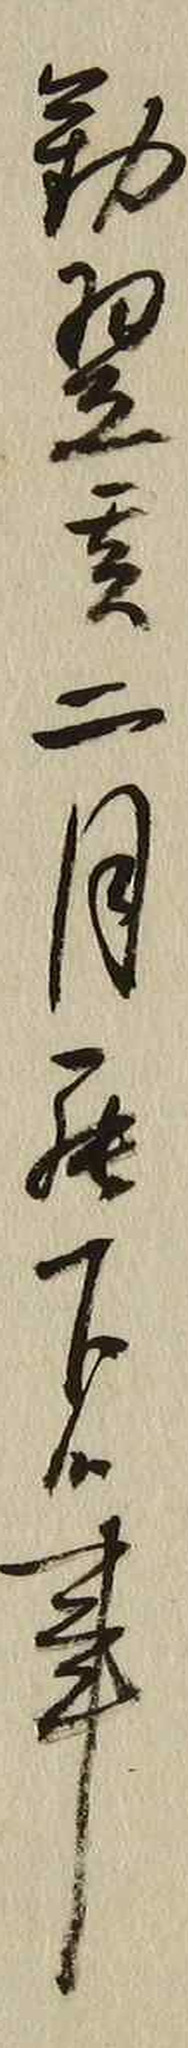勤翌亥二月罷下候事
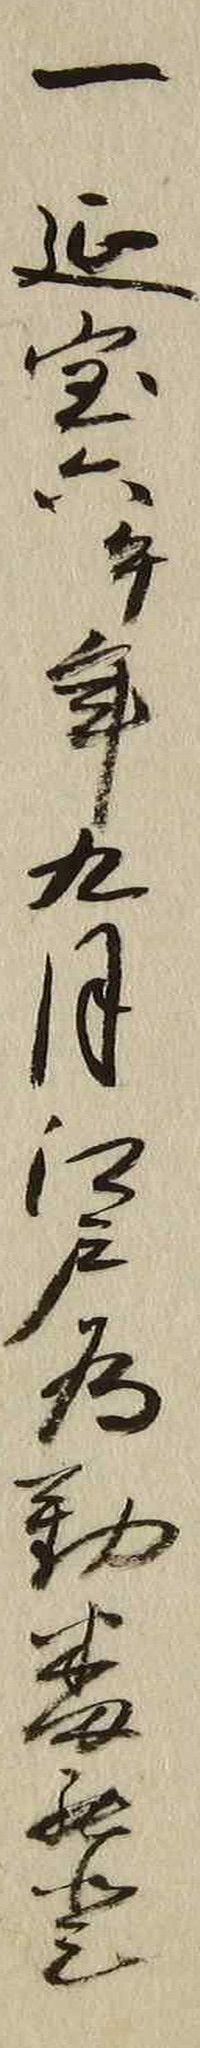一延宝六午年九月江戸為勤番罷登
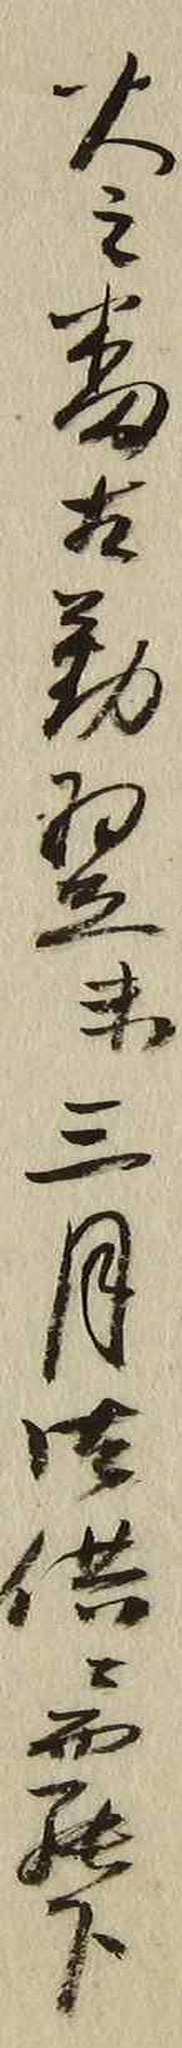火之番相勤翌未三月御供ニ而罷下
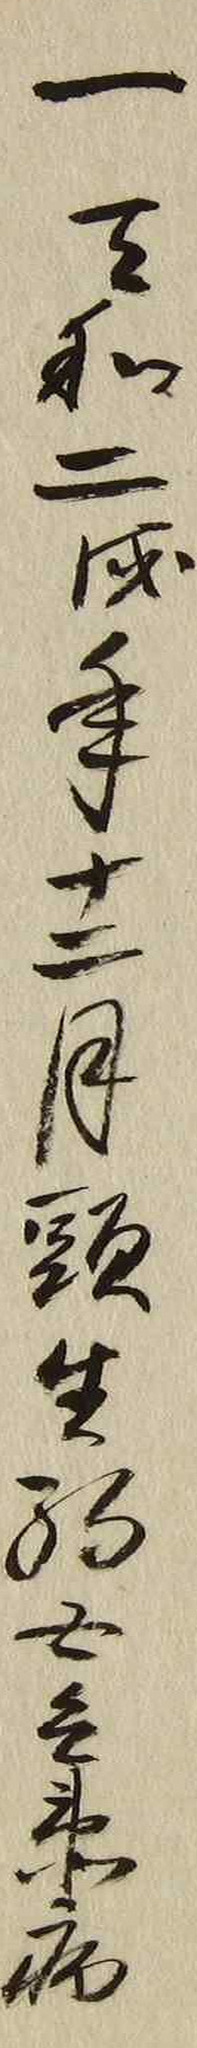一天和二戌年十二月頭生駒五兵衛病
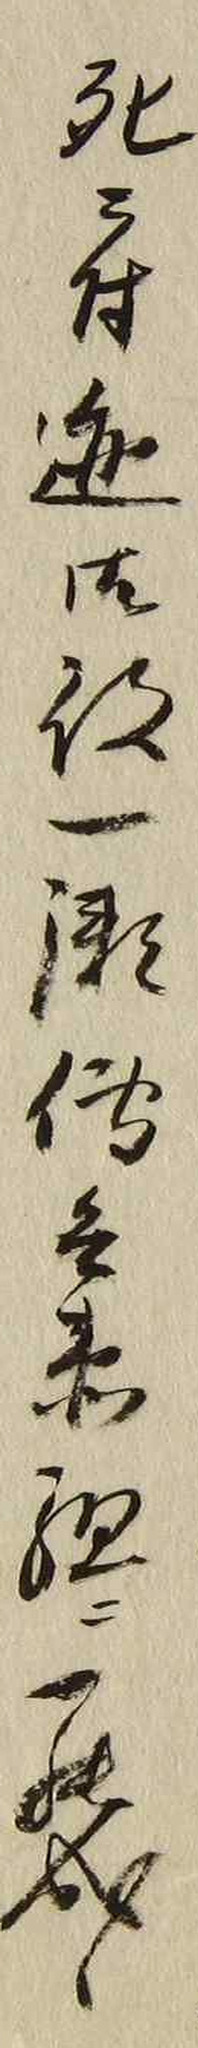死ニ付迹御役一瀬伝兵衛組ニ罷成候
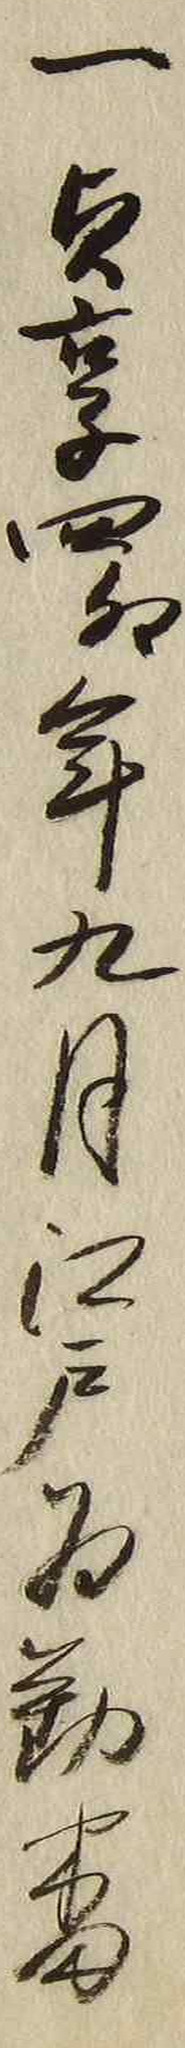一貞享四卯年九月江戸為勤番
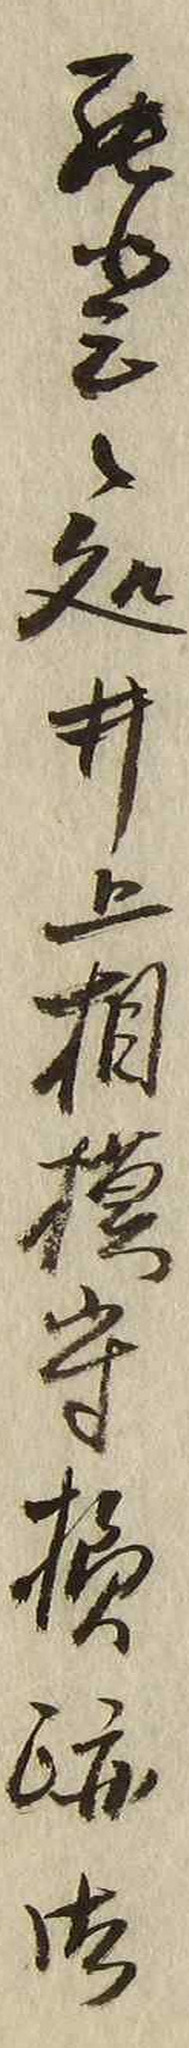罷登候処井上相模守様跡御
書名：諸士系譜　巻之356　す之部6
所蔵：会津若松市立会津図書館
